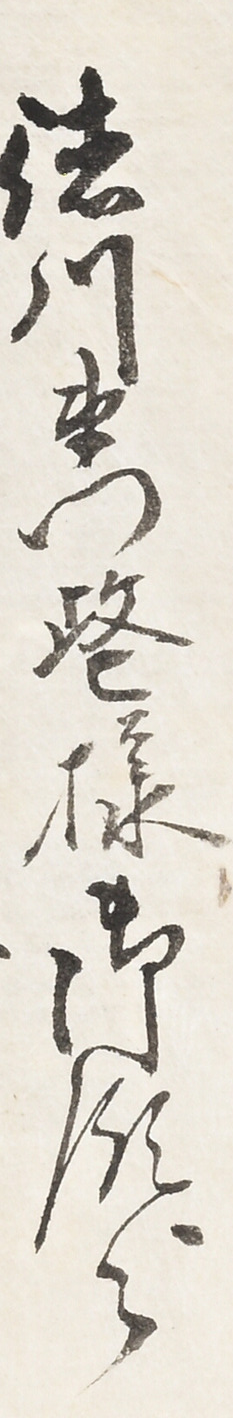徳川衛門督様御領分
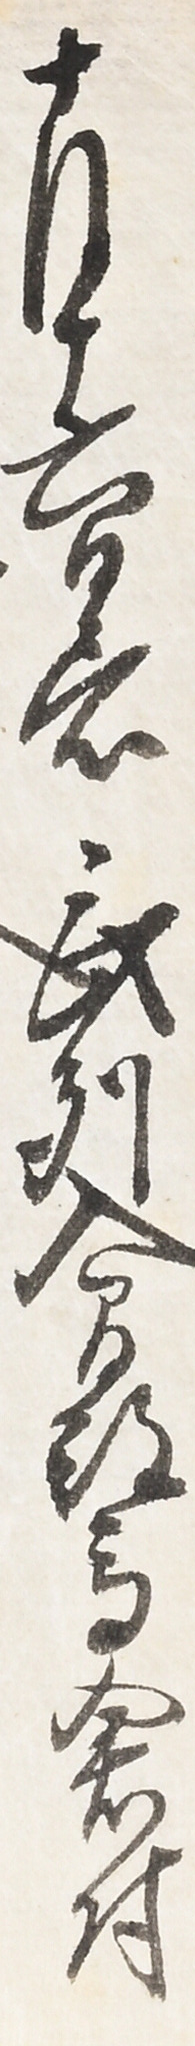十月十六日着武州入間郡高倉村
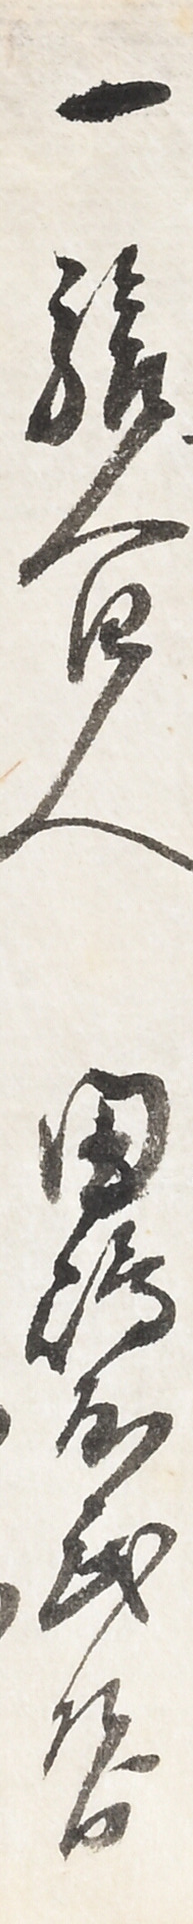一旅人四人田嶋屋武左衛門
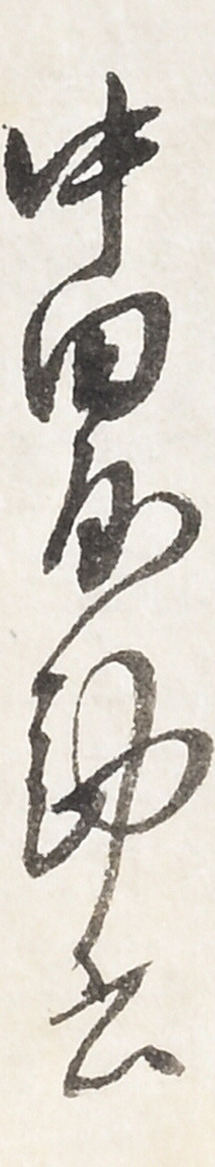中田屋勘六
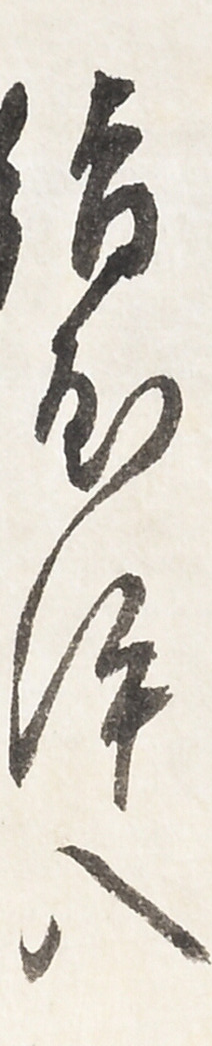絹屋伊八
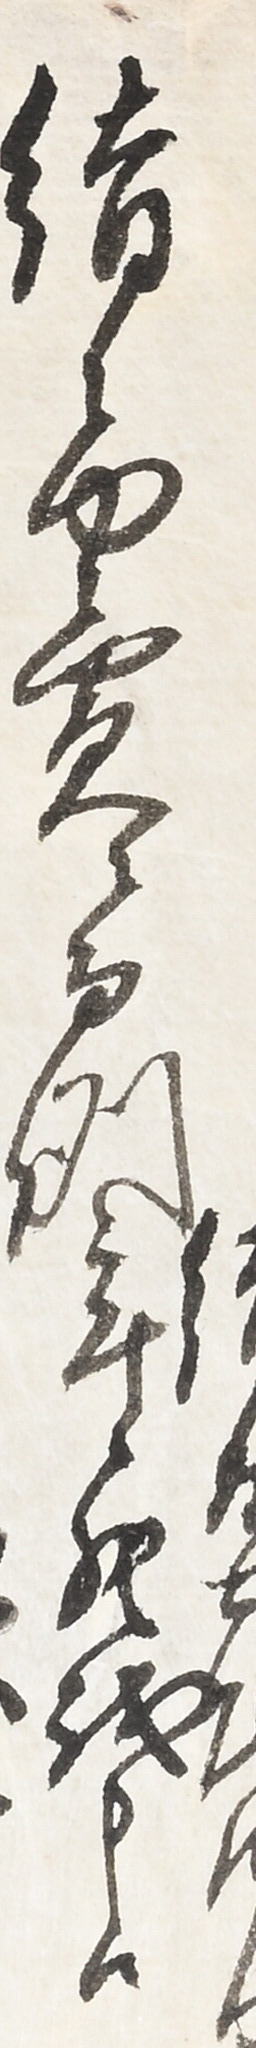絹商売ニ而例年罷越申候
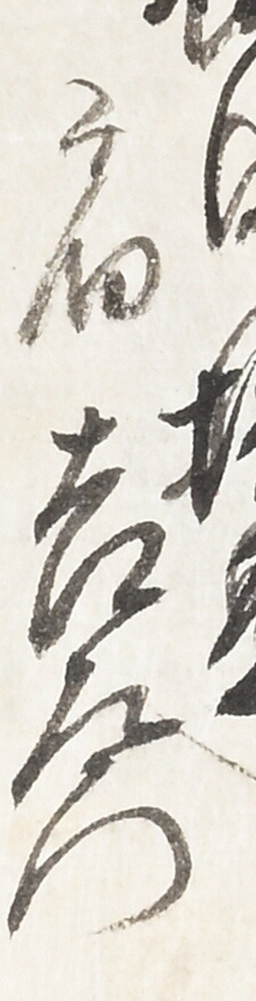宿吉左衛門
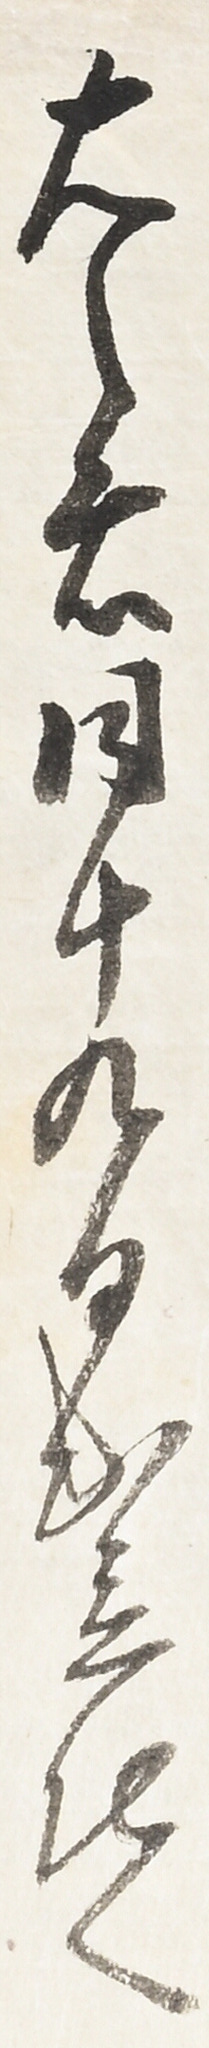右之者同十九日出立仕候
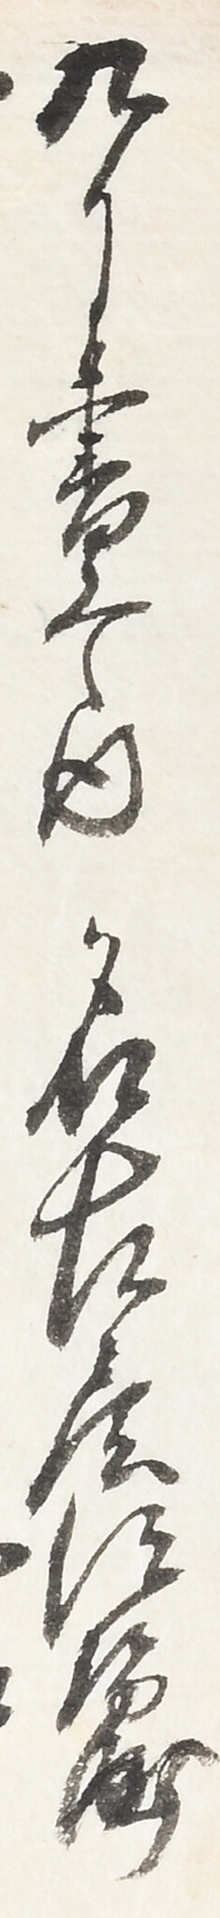九月書上之内名古屋治左衛門
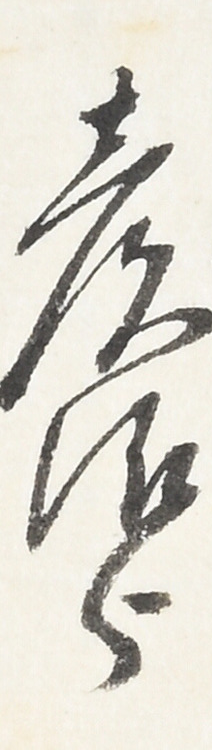彦治郎
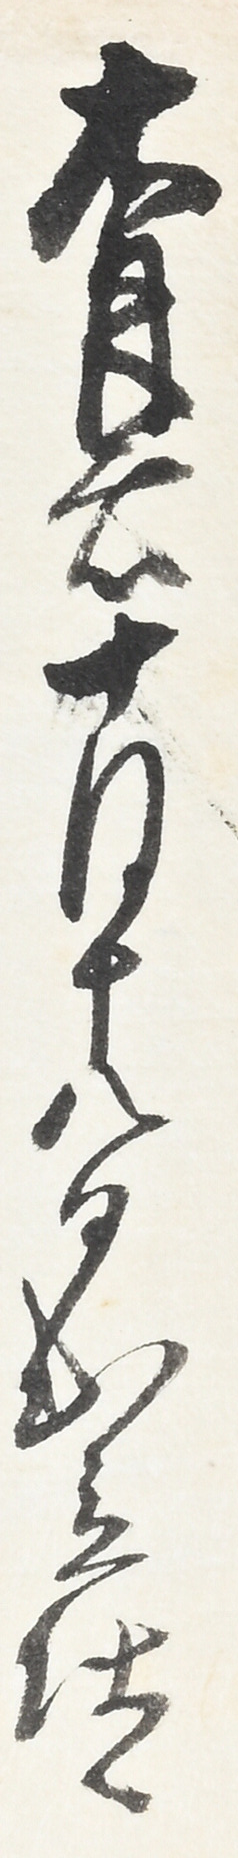右之者十月十八日出立仕候
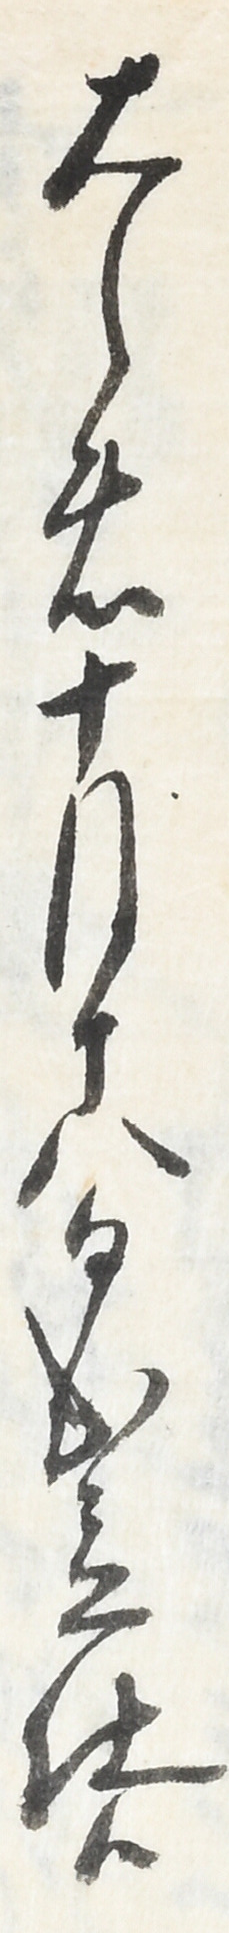右之者十月十八日出立仕候

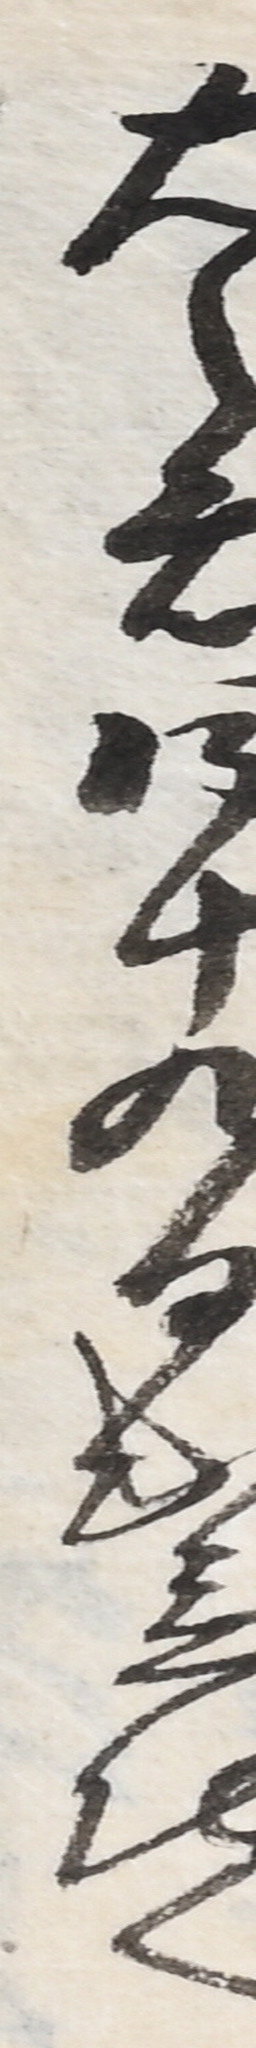右之者十月十八日出立仕候
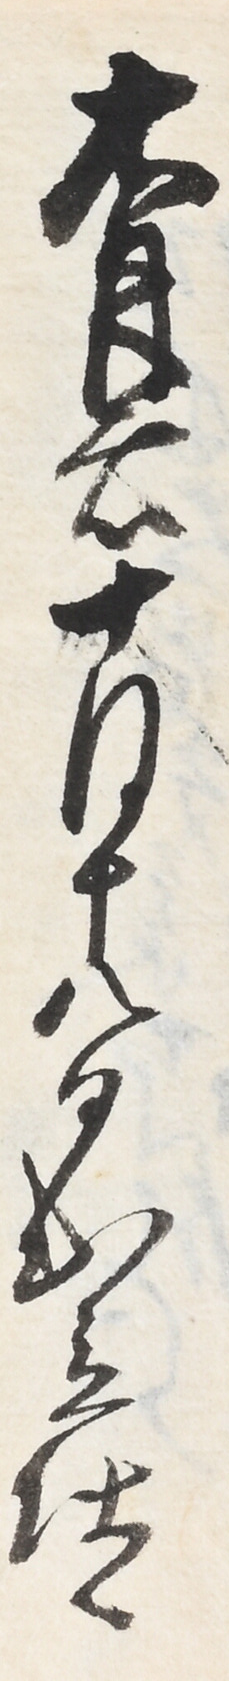右之者十月十八日出立仕候
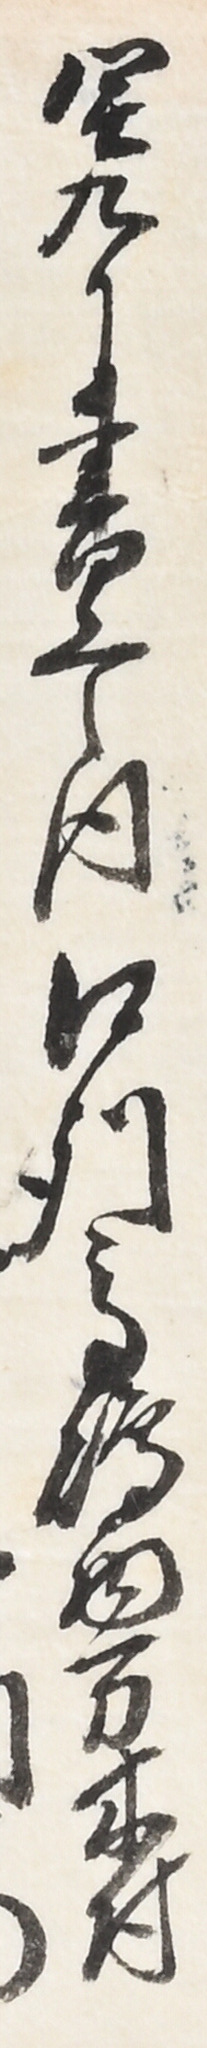閏九月書上之内江州高嶋内万木村
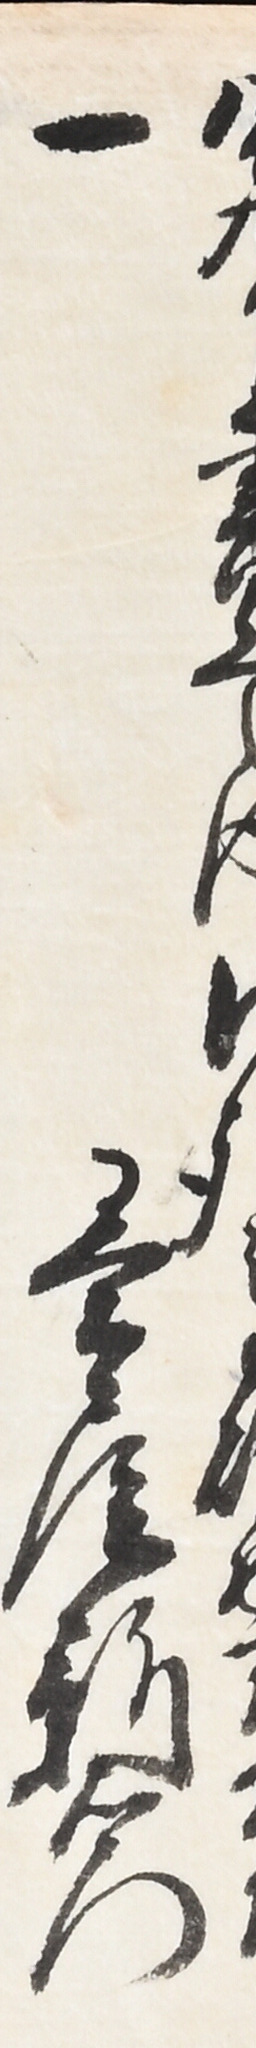一墨屋新右衛門
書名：旅人泊控帳
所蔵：伊那市立高遠町図書館・合同会社AMANE
